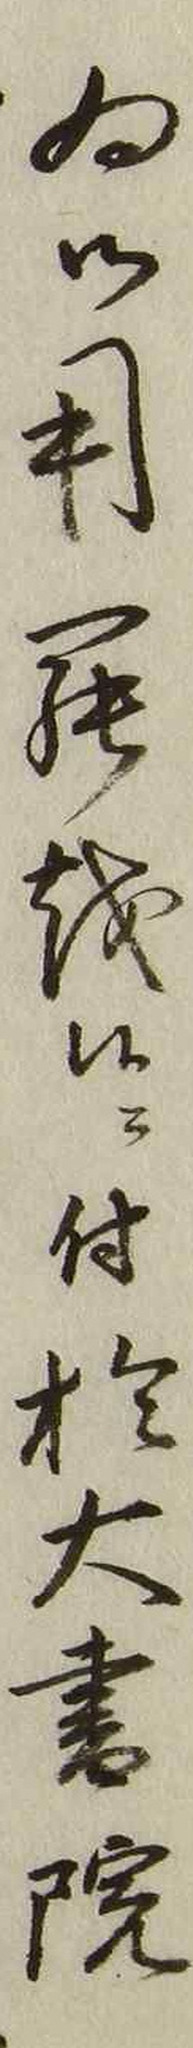為御用罷越候ニ付於大書院
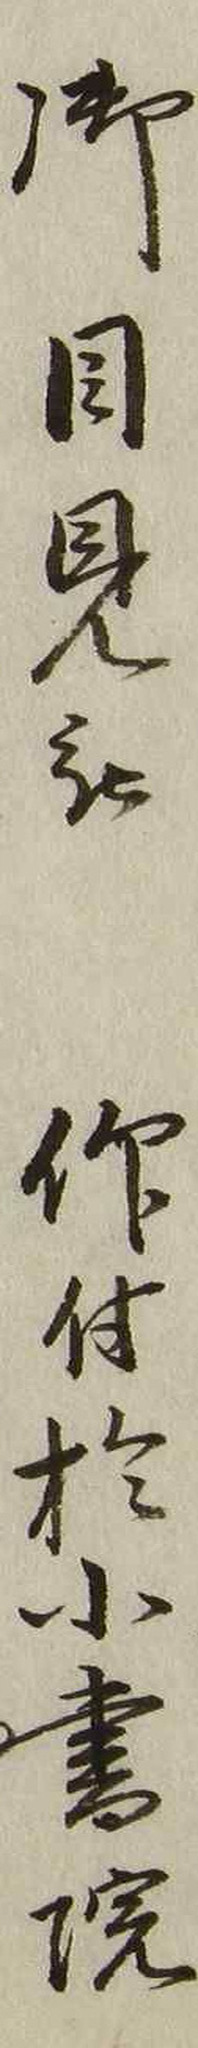御目見被仰付於小書院
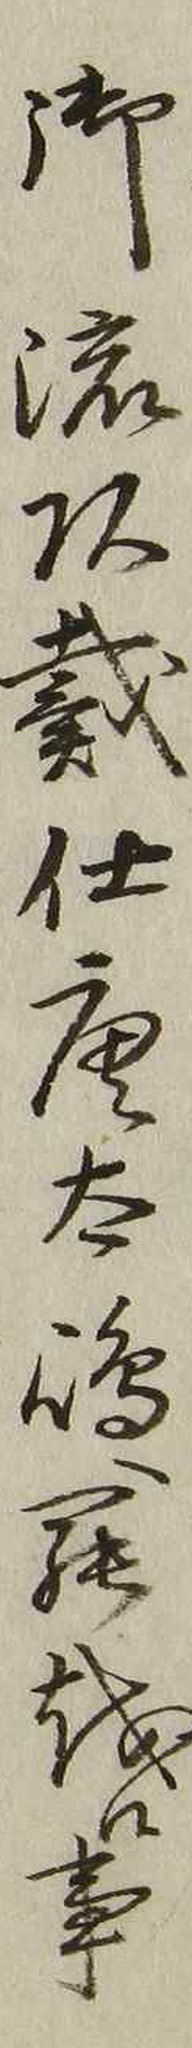御流頂戴仕唐太嶋へ罷越候事
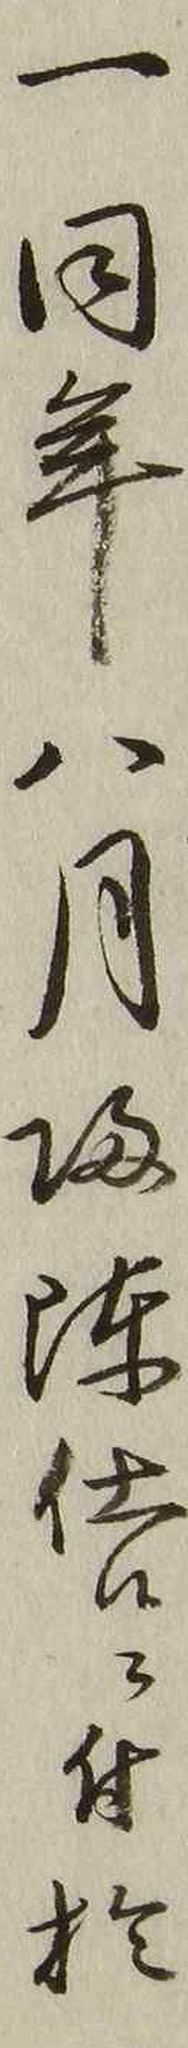一同年八月帰陣仕候ニ付於
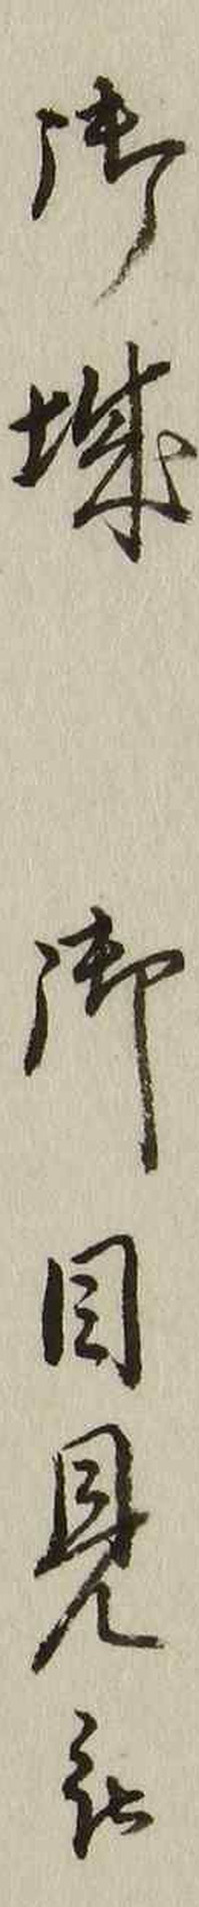御城御目見被
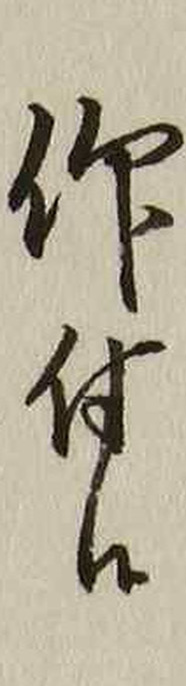仰付候
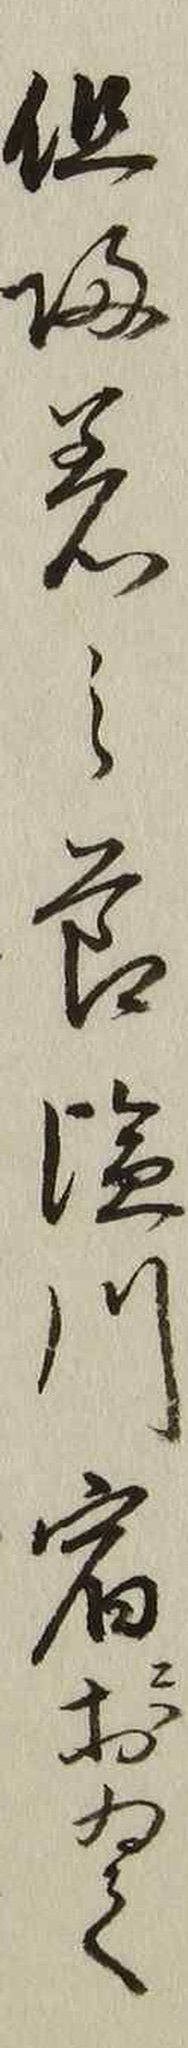但帰着之節塩川宿ニおゐて
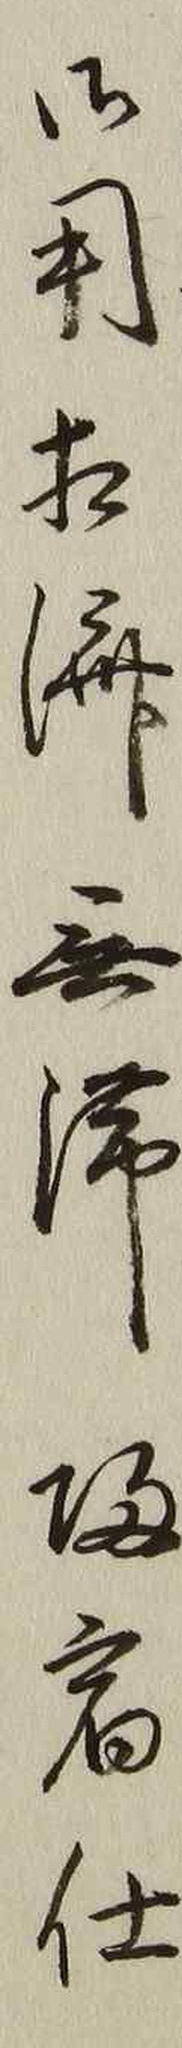御用相済無滞帰宿仕
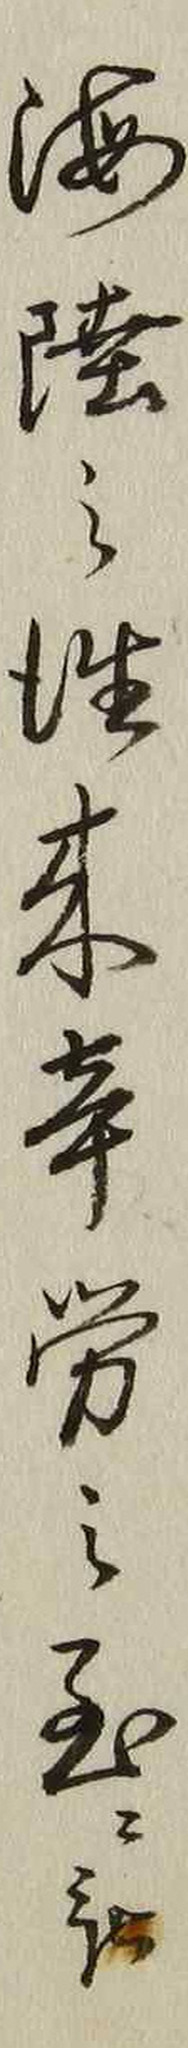海陸之徃来辛労之至ニ被
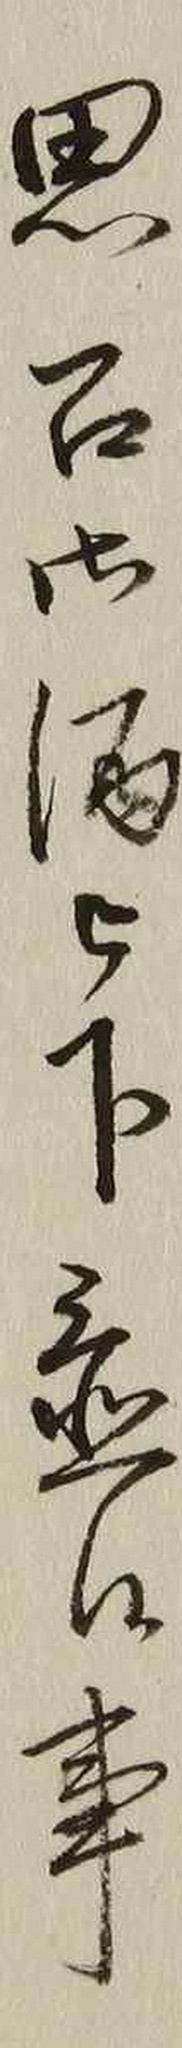思召御酒被下置候事
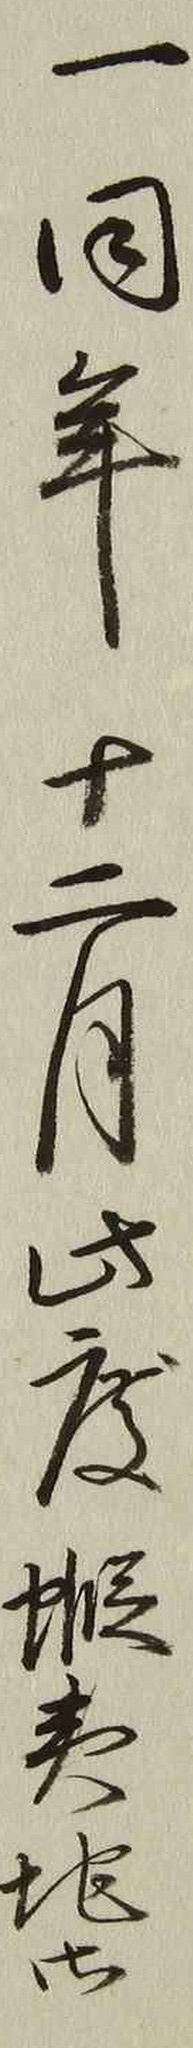一同年十二月此度蝦夷地御
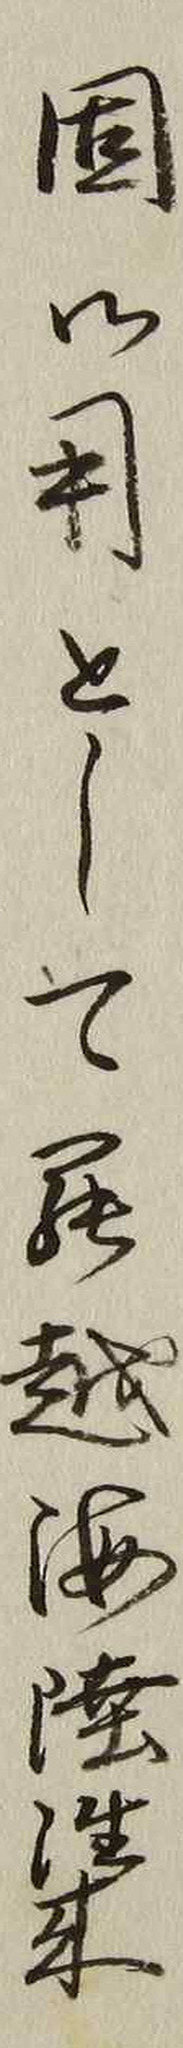固御用として罷越海陸徃来
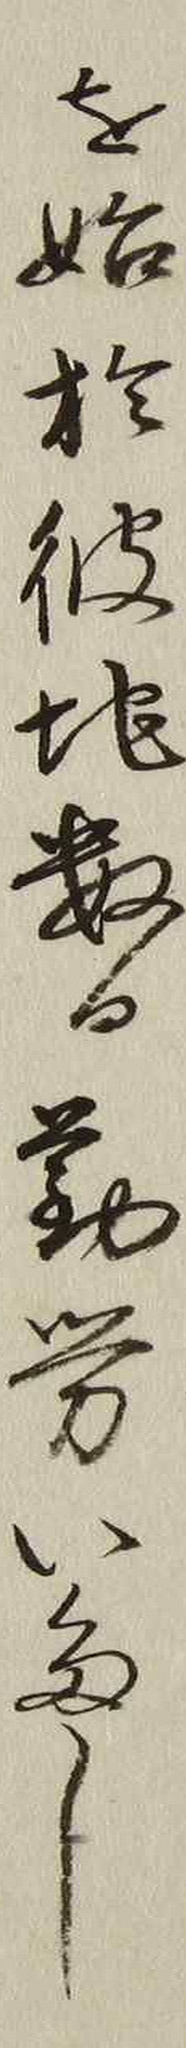を始於彼地数日勤労いたし
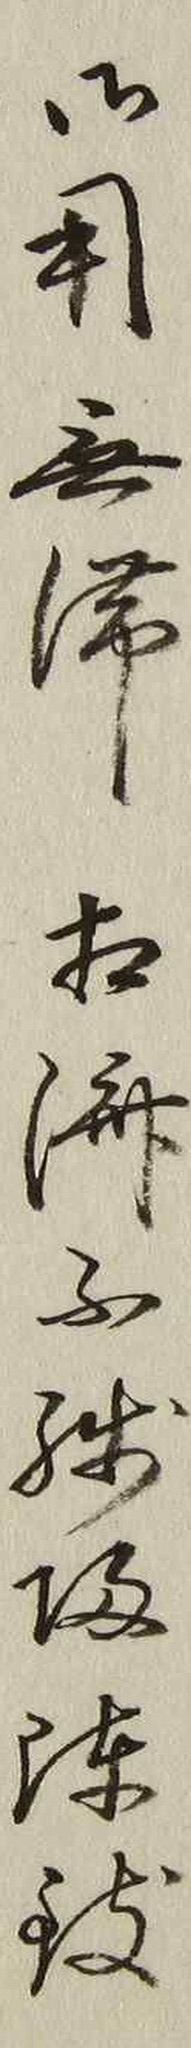御用無滞相済不残帰陣致
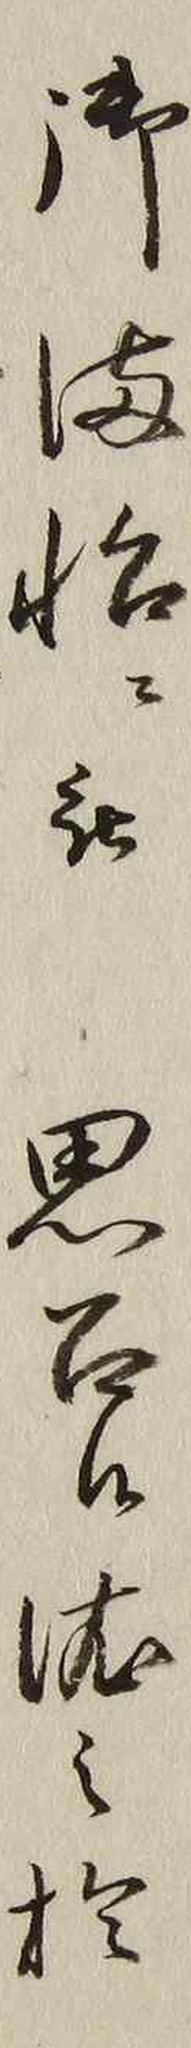御満怡ニ被思召候依之於
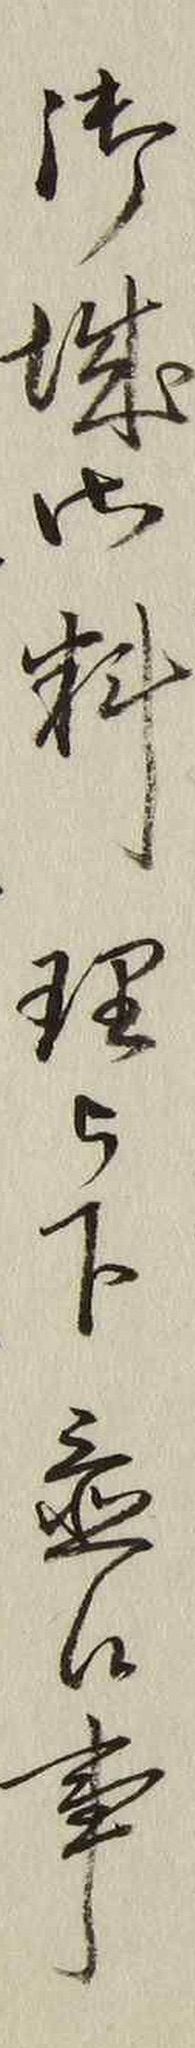御城御料理被下置候事
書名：諸士系譜　巻之136　た之部12
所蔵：会津若松市立会津図書館
